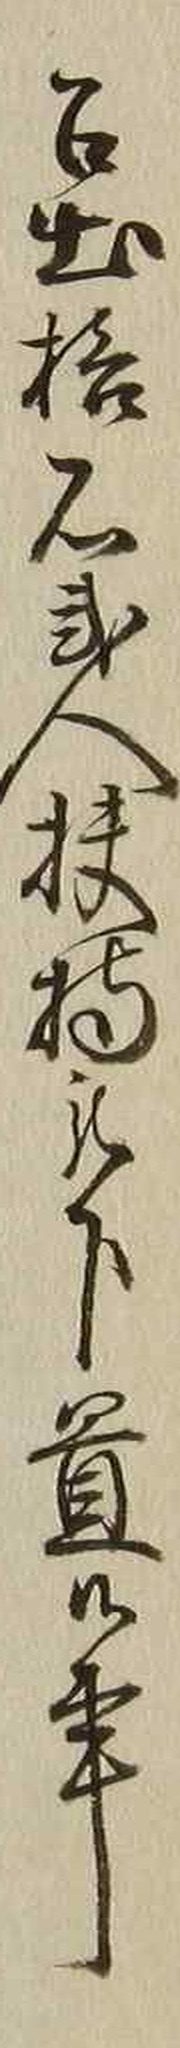召出拾石弐人扶持被下置候事
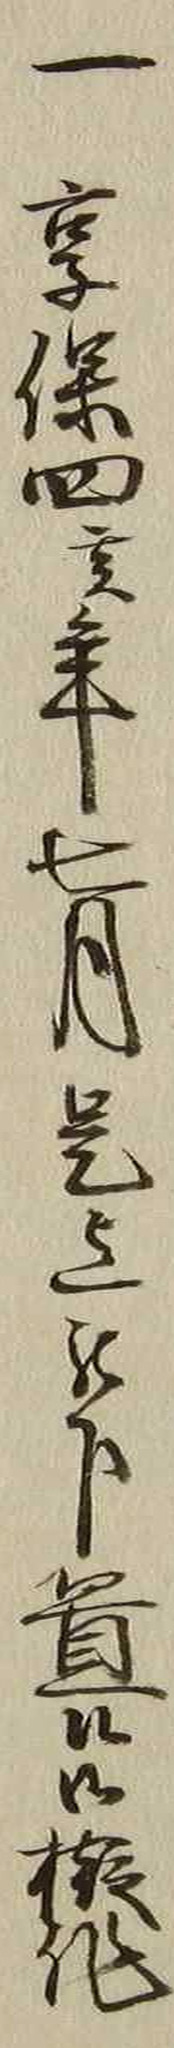一享保四亥年七月是迄被下置候御擬作
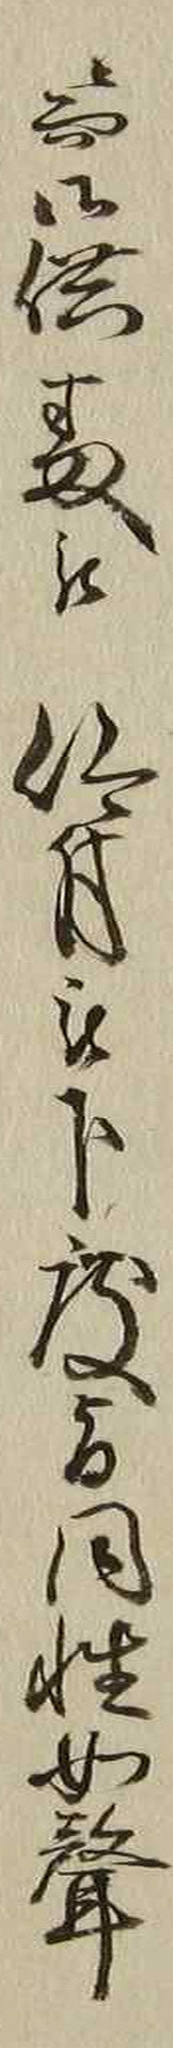に而御供番被仰付被下度旨同性女婿
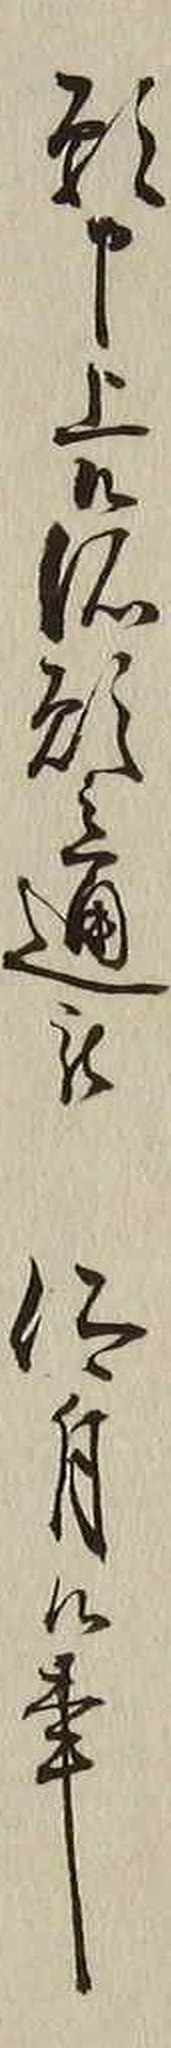願申上候所願之通被仰付候事
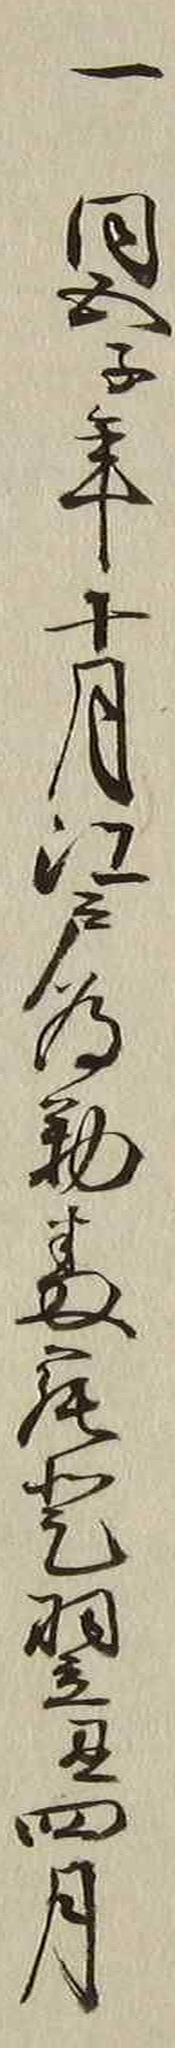一同五子年十月江戸為勤番罷登翌丑四月
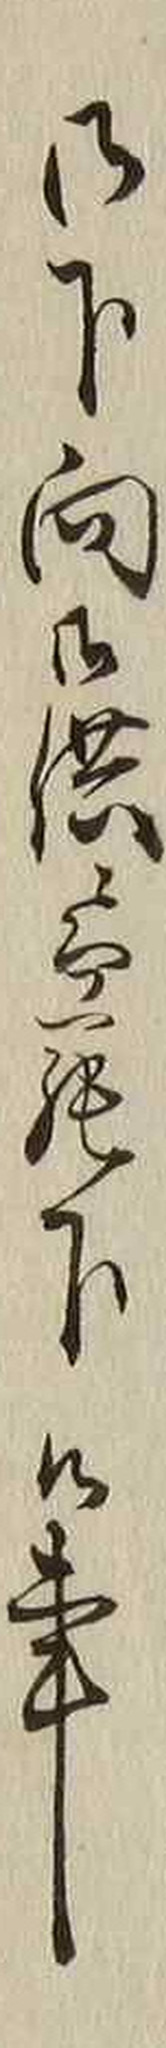御下向御供に而罷下候事
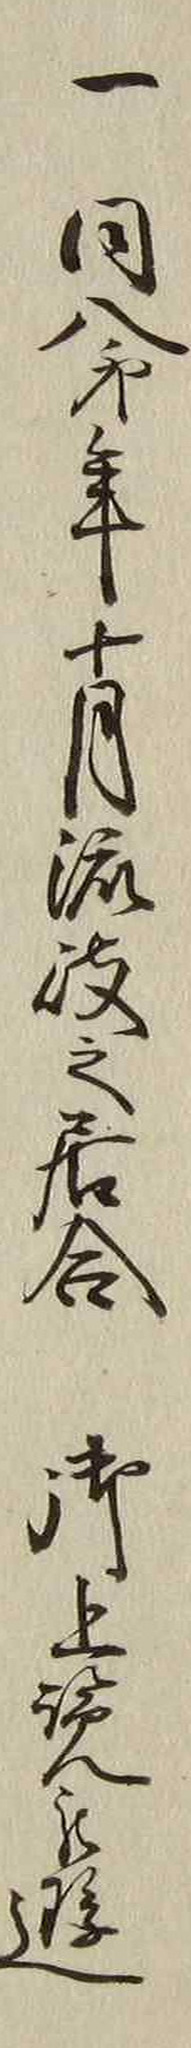一同八卯年十月流岐之居合御上覧被遊
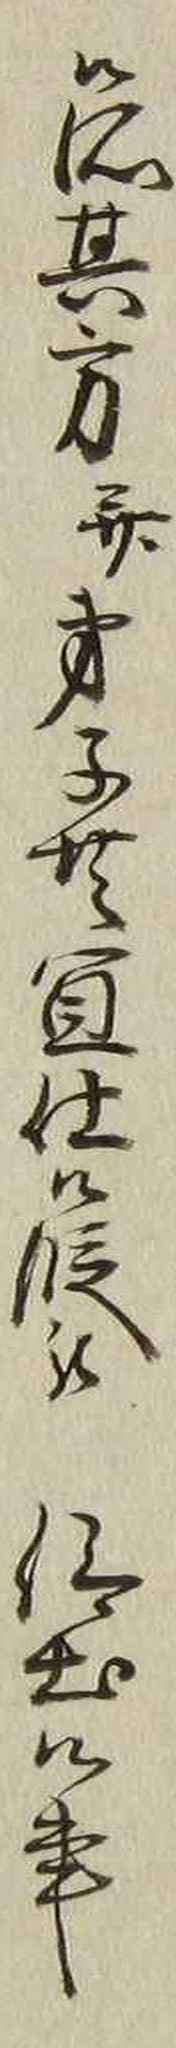候所其方并弟子共宜仕候段被仰出候事
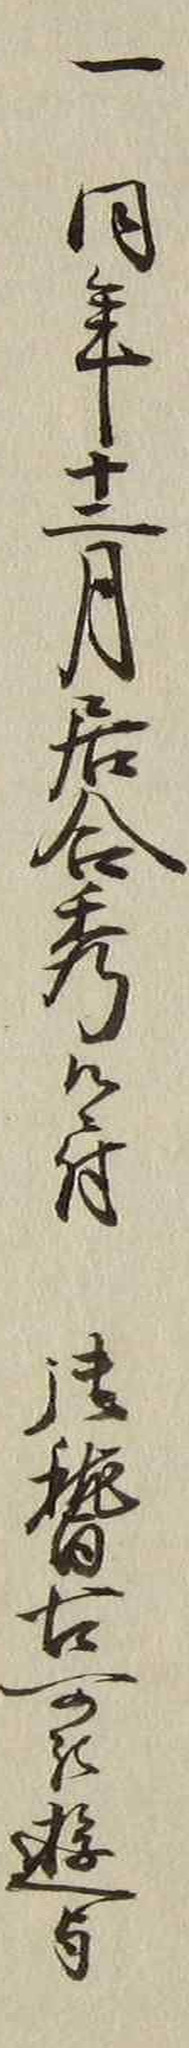一同年十二月居合秀候に付御稽古可被遊と
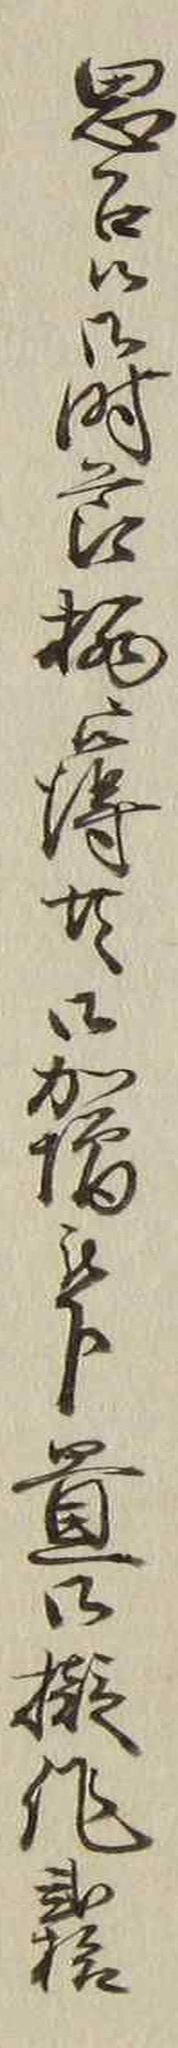思召候御時節柄に候得共御加増被下置御擬作弐拾
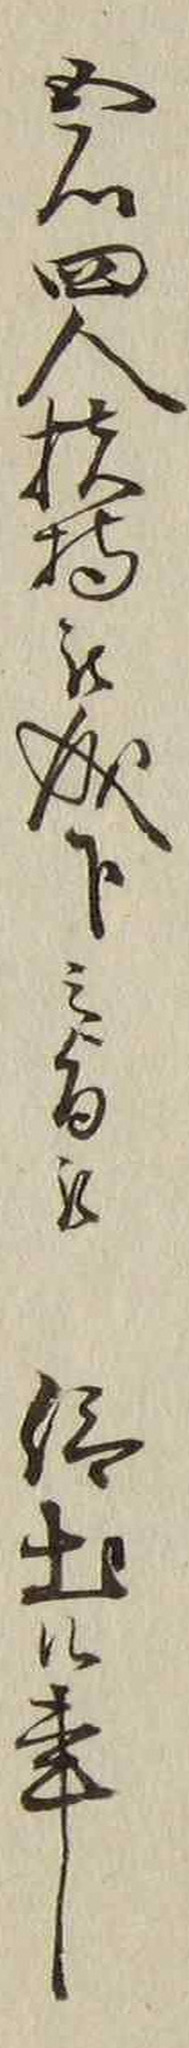五石四人扶持被成下之旨被仰出候事
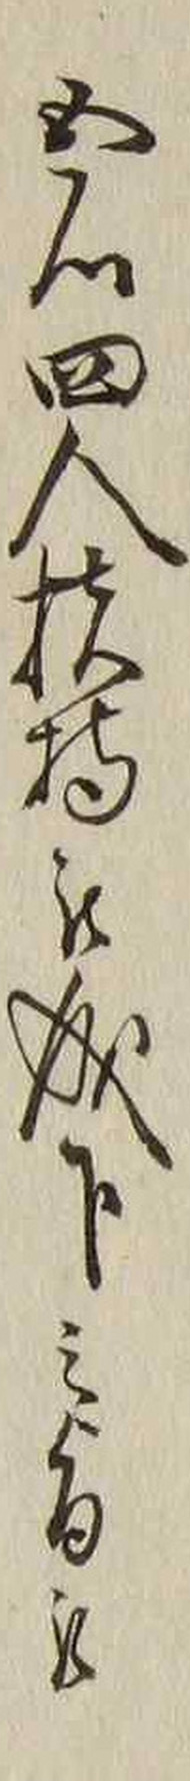五石四人扶持被成下之旨被仰出候事
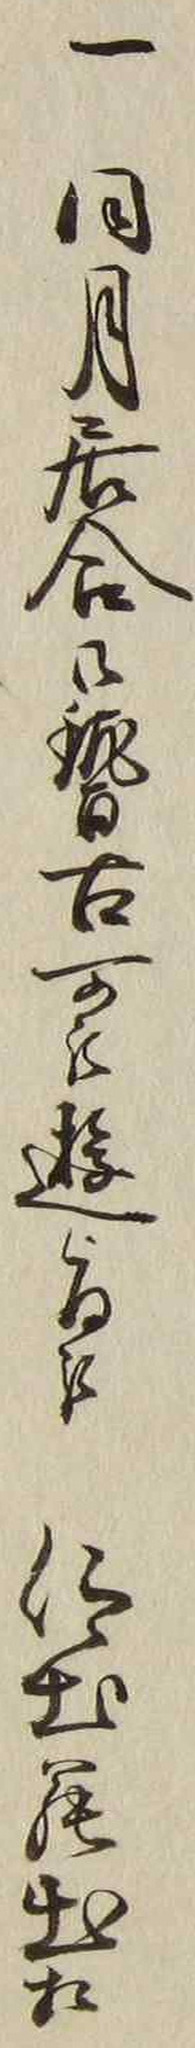一同月居合御稽古可被遊旨被仰出罷出相
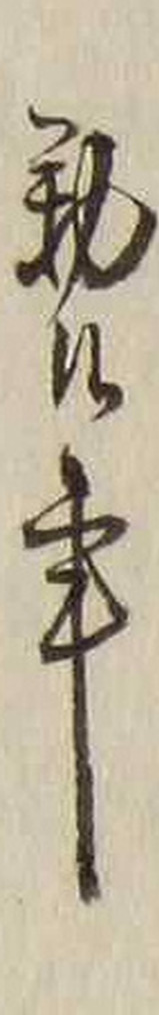動候事

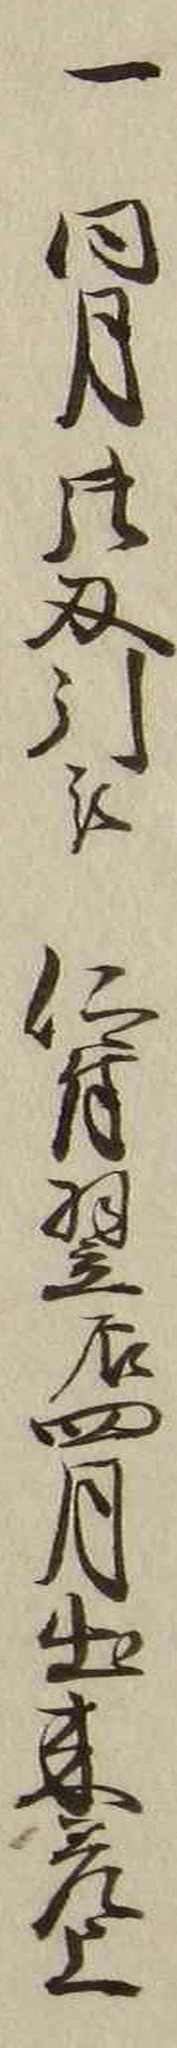一同月御刃引被仰付翌辰四月出来差上
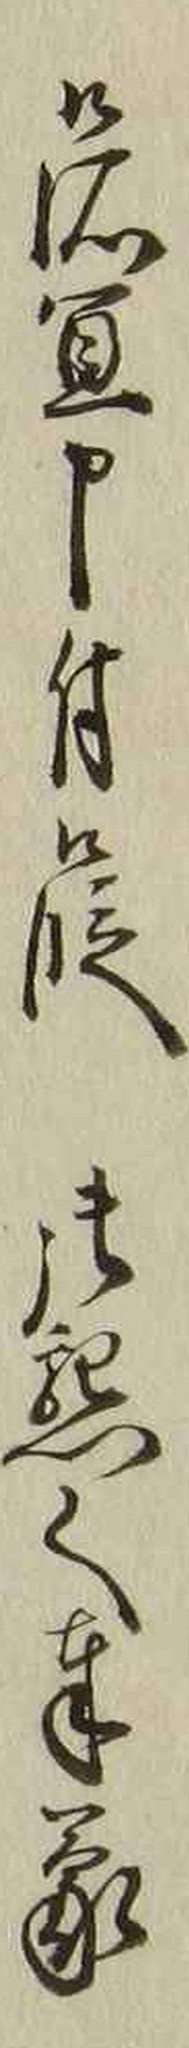候所宜申付候段御懇之奉蒙
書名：諸士系譜　巻之67　を之部1
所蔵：会津若松市立会津図書館
